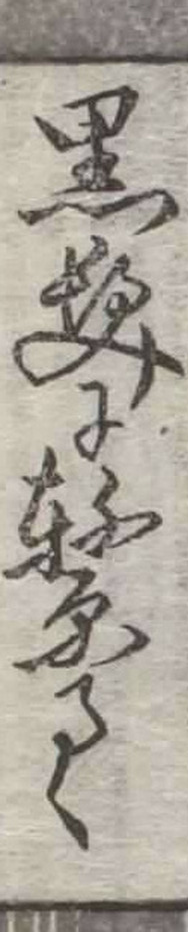黒髪に繫るゝ
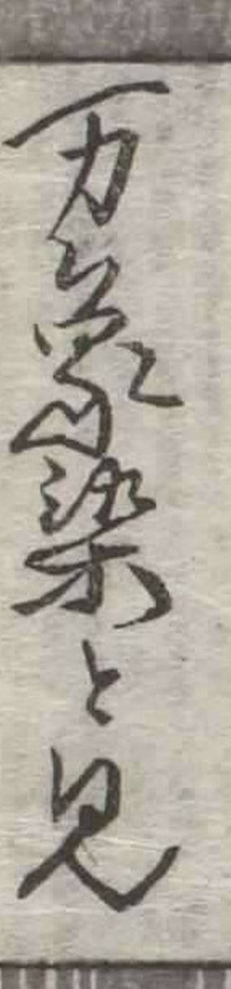万象染と見
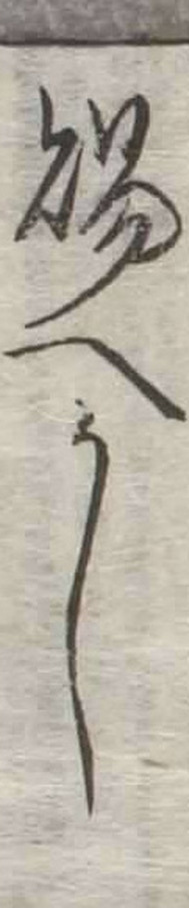賜へかし
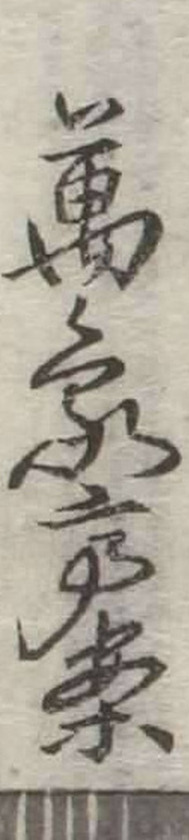萬象亭案

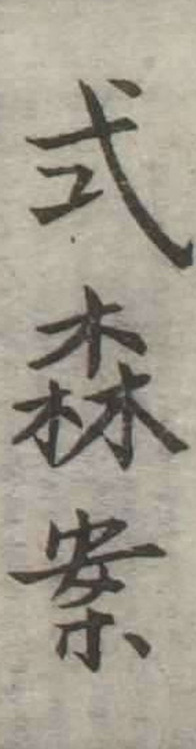式森案
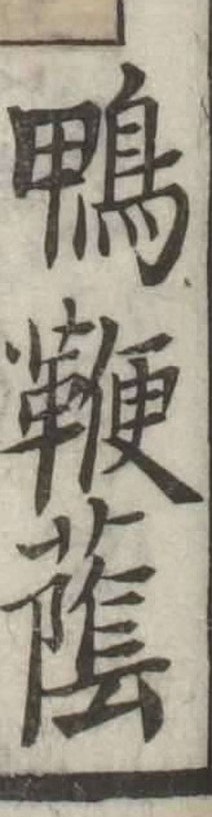鴨鞭蔭
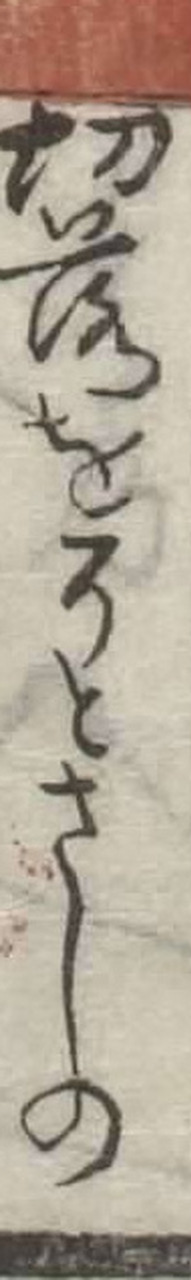切落をそとさしの
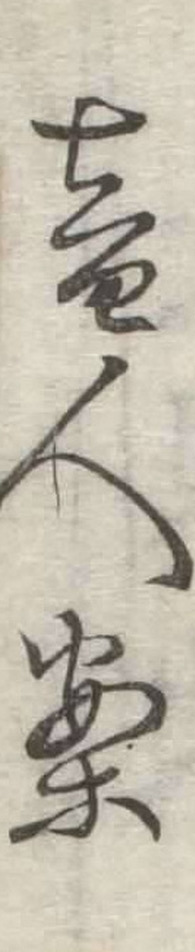音人案
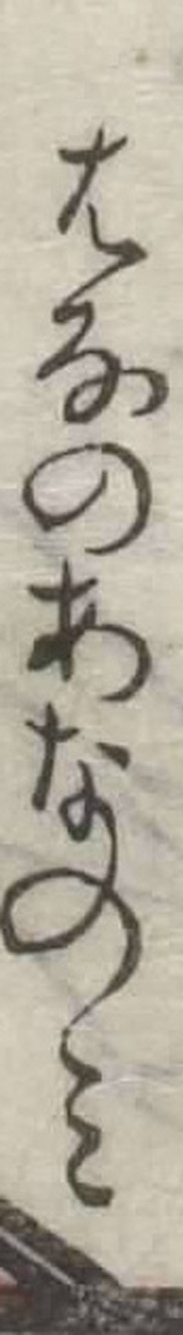はなのあなのみ
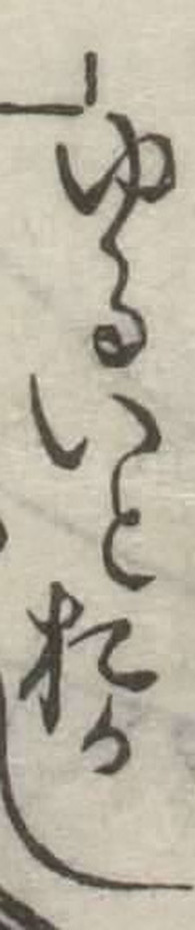ゆるいとおかし

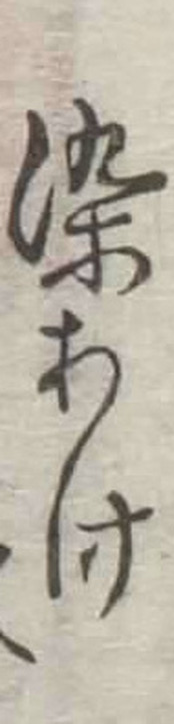染あけて
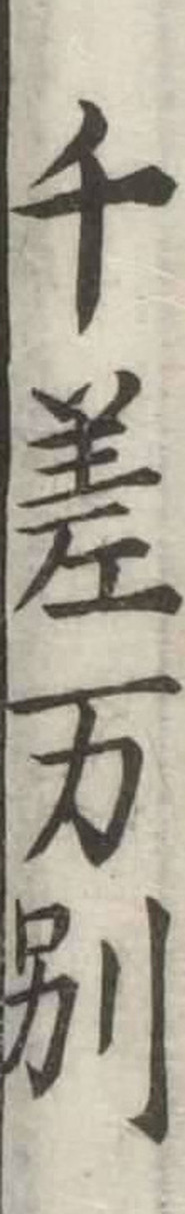千差万別
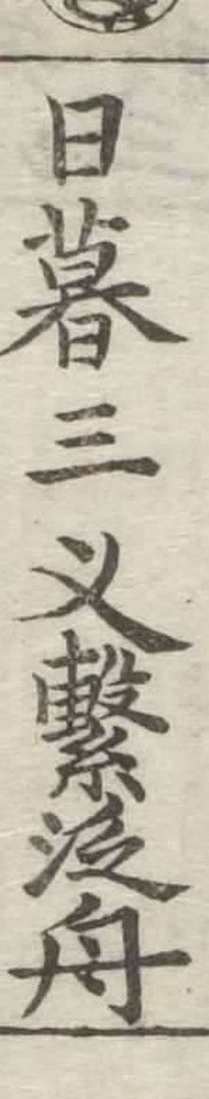日暮三叉繋泛舟
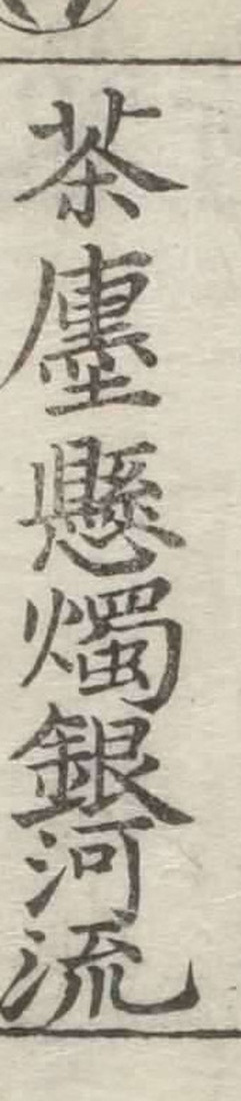茶廛懸燭銀河流
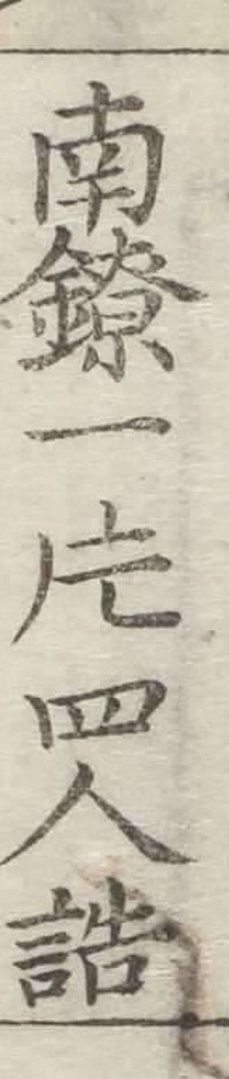南鐐一片四人誥
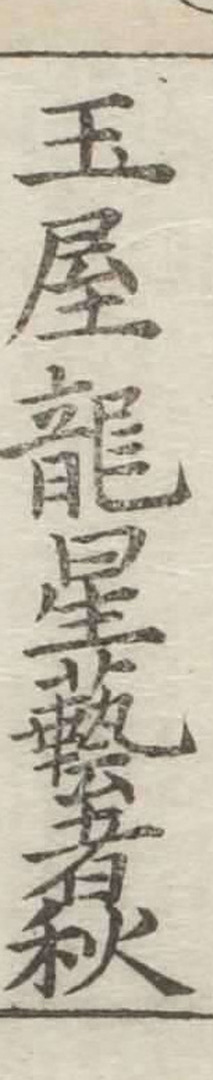玉屋龍星芸者秋
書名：たなくひあわせ
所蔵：国文学研究資料館
